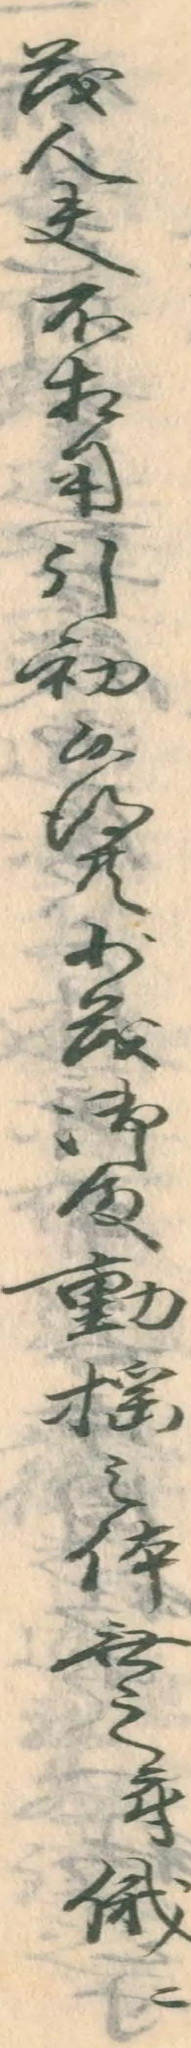茂人夫不相用引初候得共少も御殿動揺之体無之ニ付俄ニ
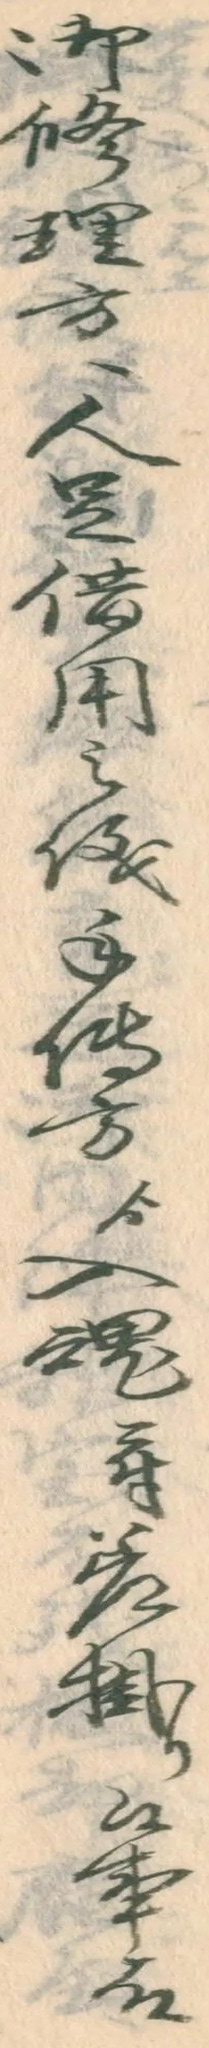御修理方へ人足借用之儀手伝方ゟ入魂ニ付差掛り候事故
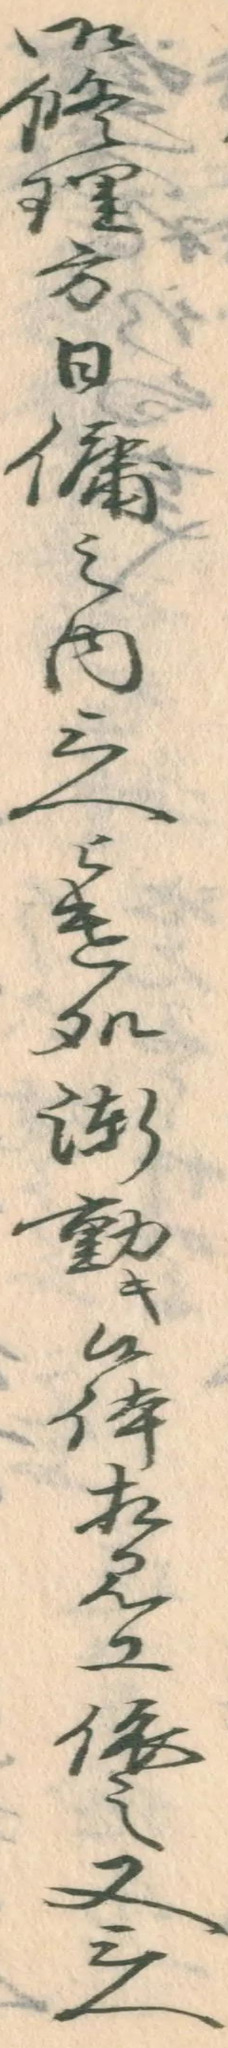御修理方日傭之内三人被遣処漸動キ候体相見ユ依之又三人
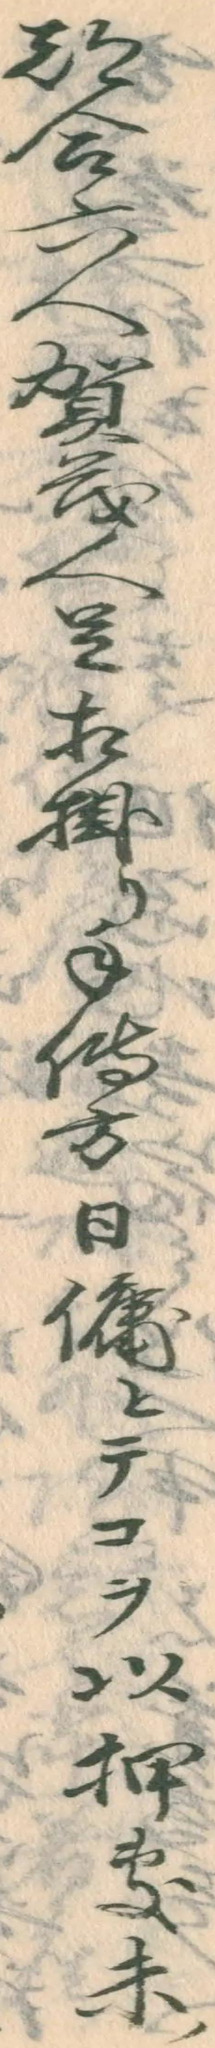都合六人賀茂人足相掛り手伝方日傭とテコヲ以押敷未ノ
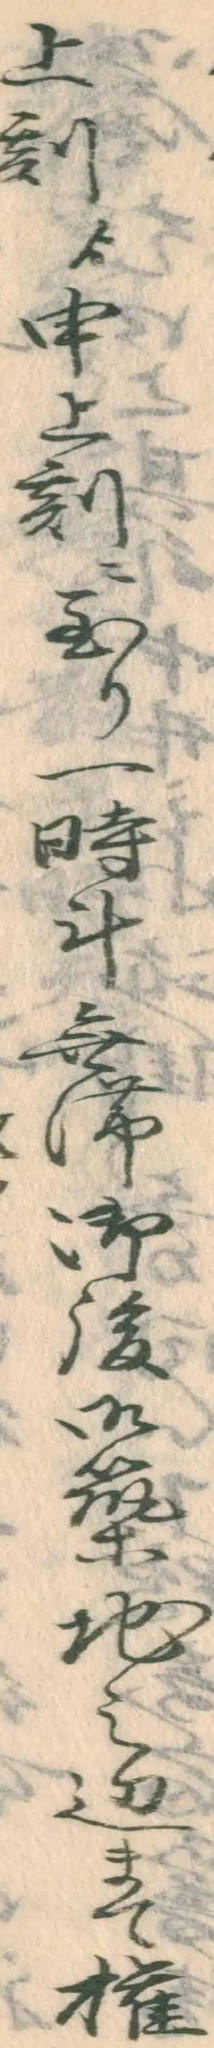上刻ゟ申上刻ニ至り一時計無滞御後御築地之辺まて権
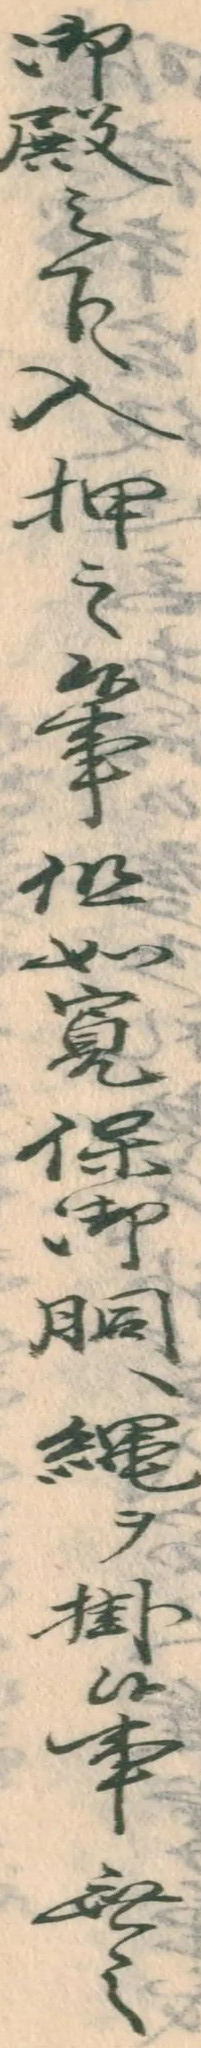御殿之下入押之候事但如寛保御胴へ縄ヲ掛候事無之
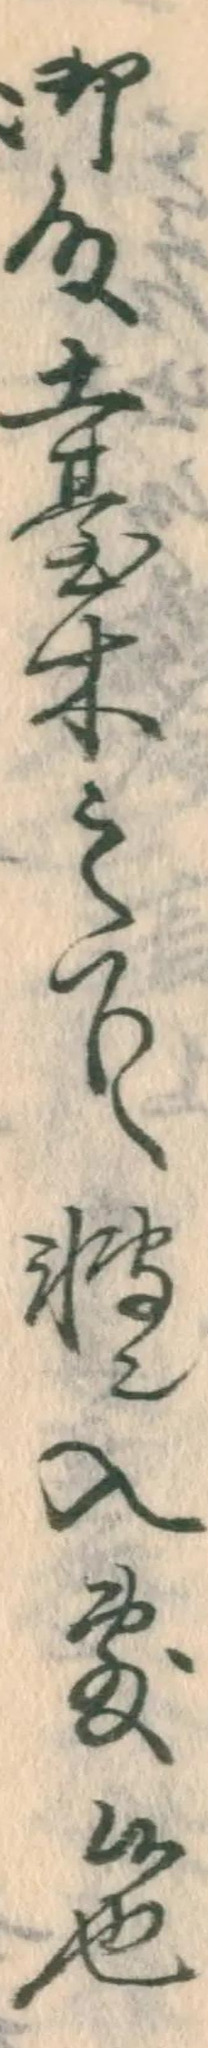御殿土台木之下へ転シ入敷候也
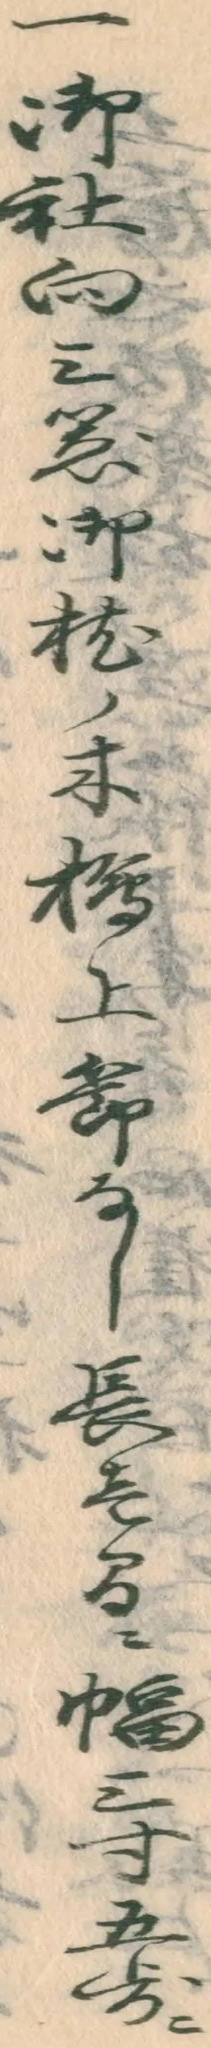一御社向三器御枕ノ木橋上節なし長壱間ニ幅三寸五歩ニ
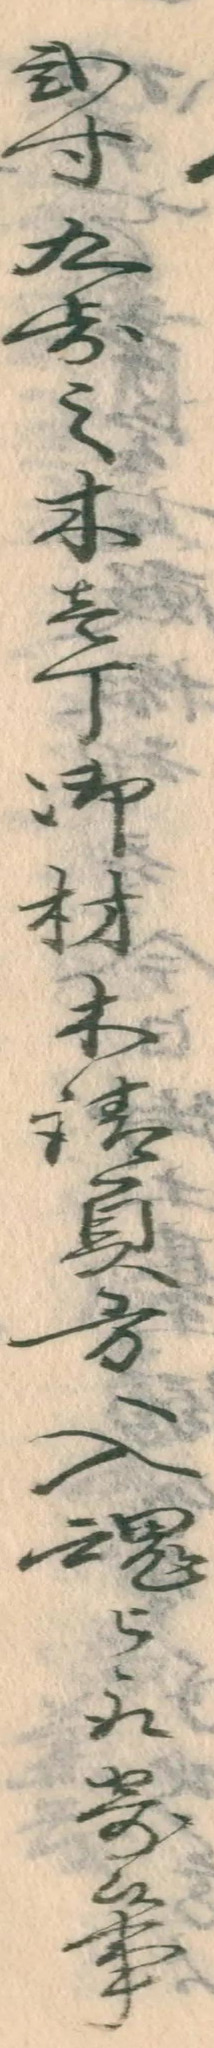弐寸九歩之木壱丁御材木請負方へ入魂被取寄候事
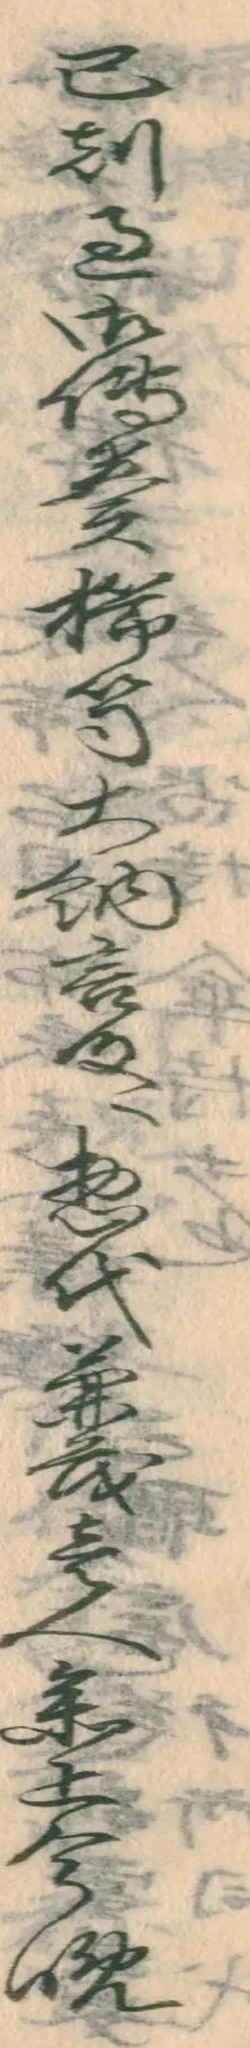一巳刻過御伝奏櫛笥大納言殿へ惣代兼茂壱人参上今晩
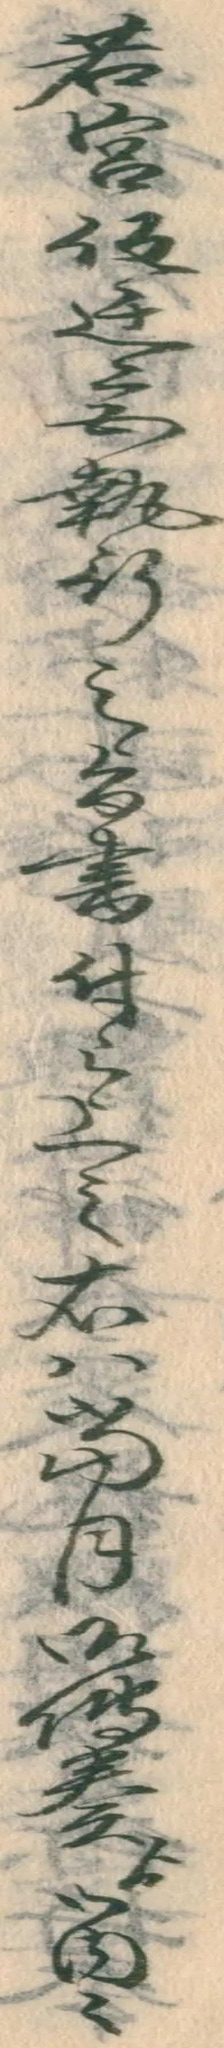若宮仮迁宮執行之旨書付被上之右ハ当月御伝奏ゟ御内々
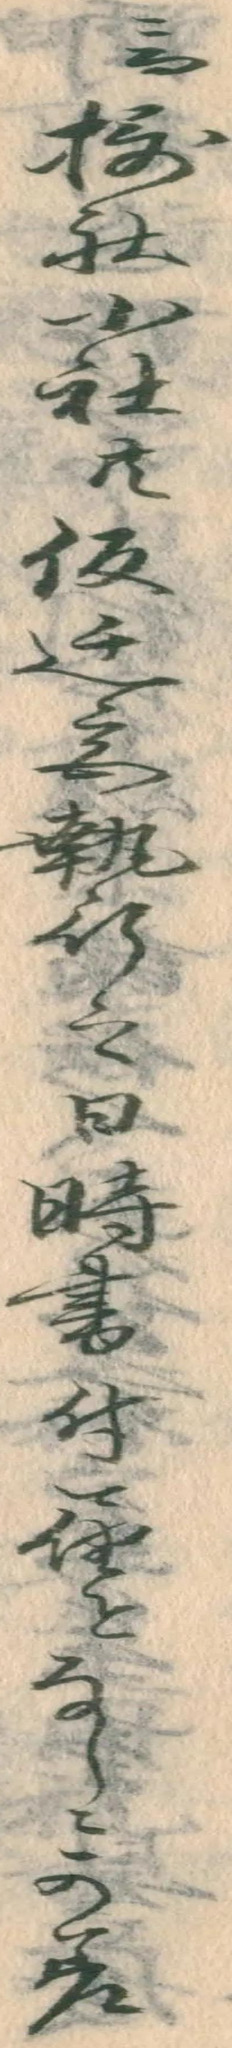ニ而摂社小社共仮迁宮執行之日時書付届となしニ可差
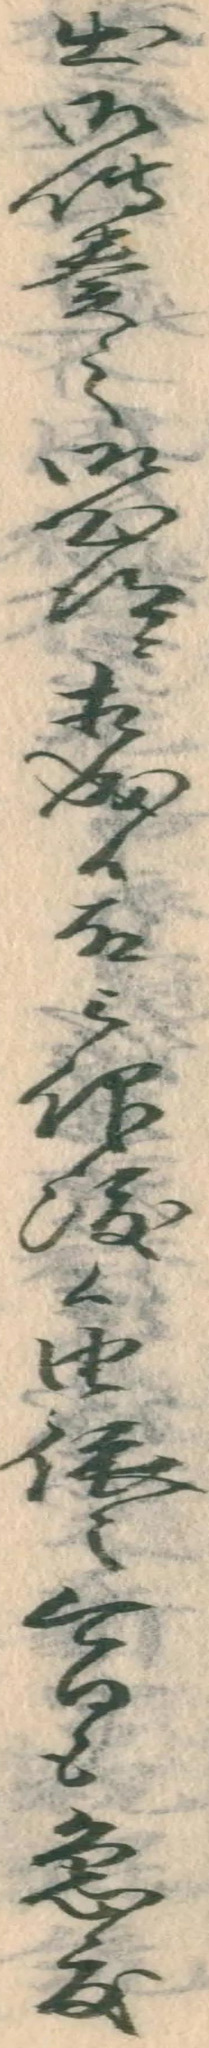出御伝奏之御心得ニ相成候故被仰渡候由依之今日も急度
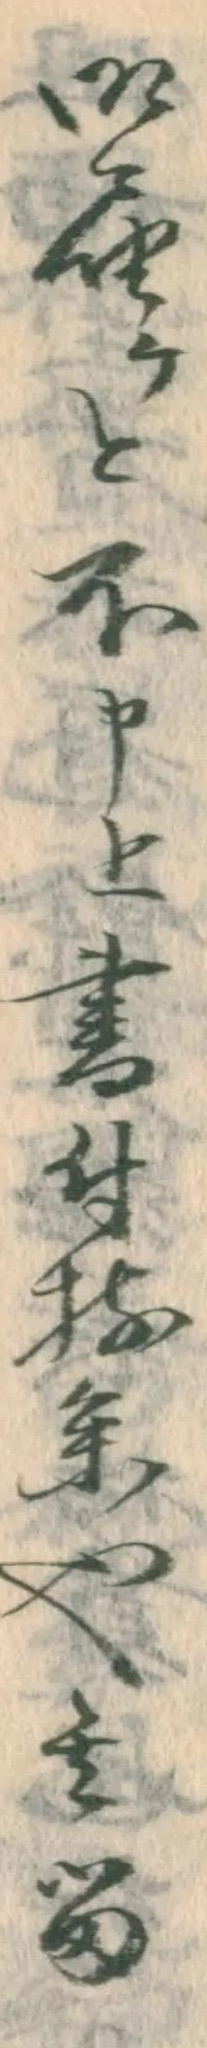御届ケと不申上書付持参也其留
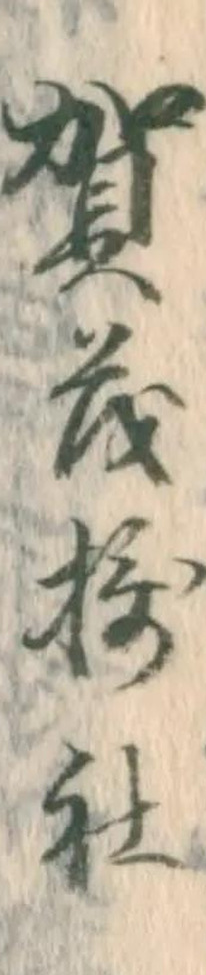賀茂摂社
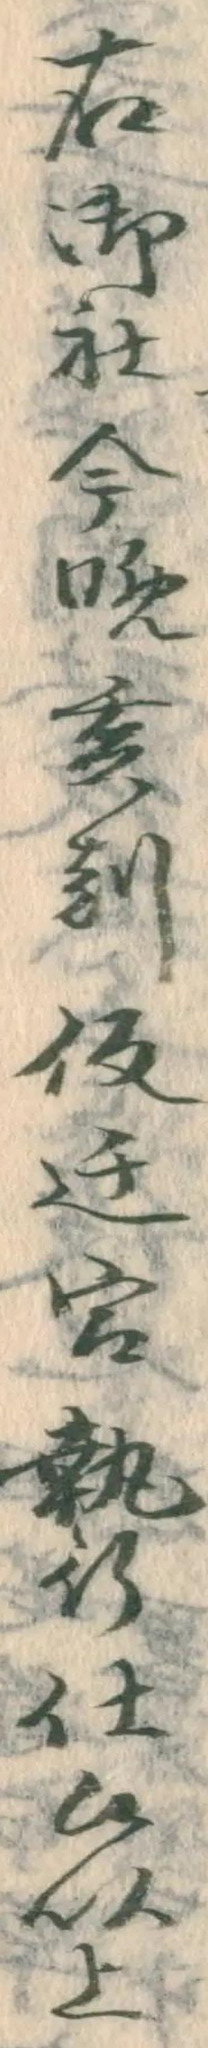右御社今晩亥刻仮迁宮執行仕候以上
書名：賀茂社記録. 第17冊
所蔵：国立国会図書館 National Diet Library, JAPAN
